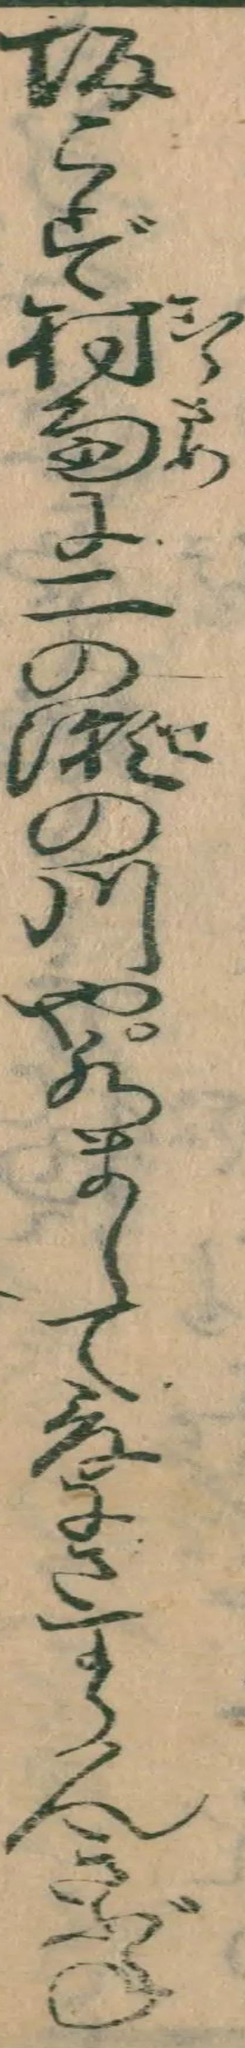坂こず村雨に二の瀬の川や。水まして爰にさすらんきぶね
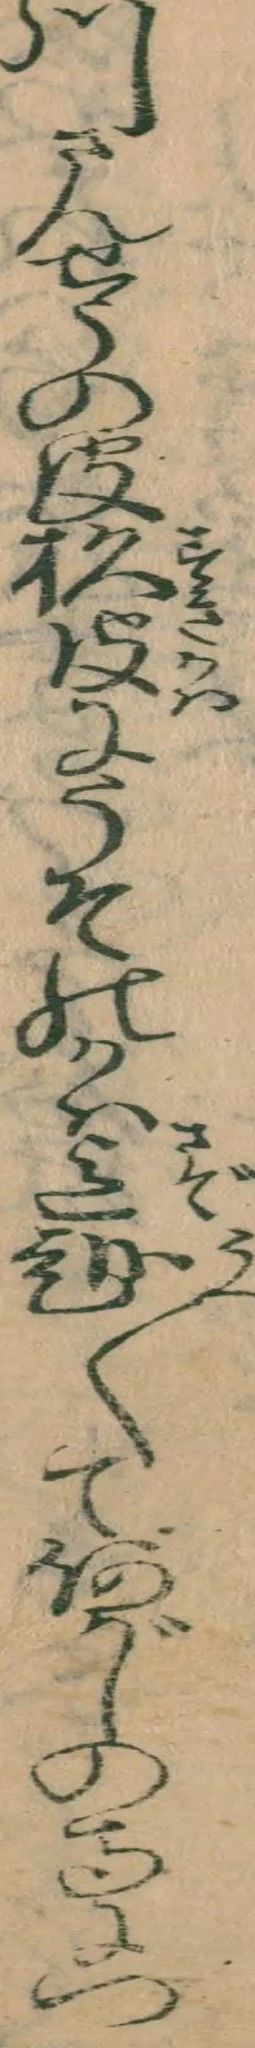川さんせうの皮杉皮にうそのかは迄越々て何がしの寺につ
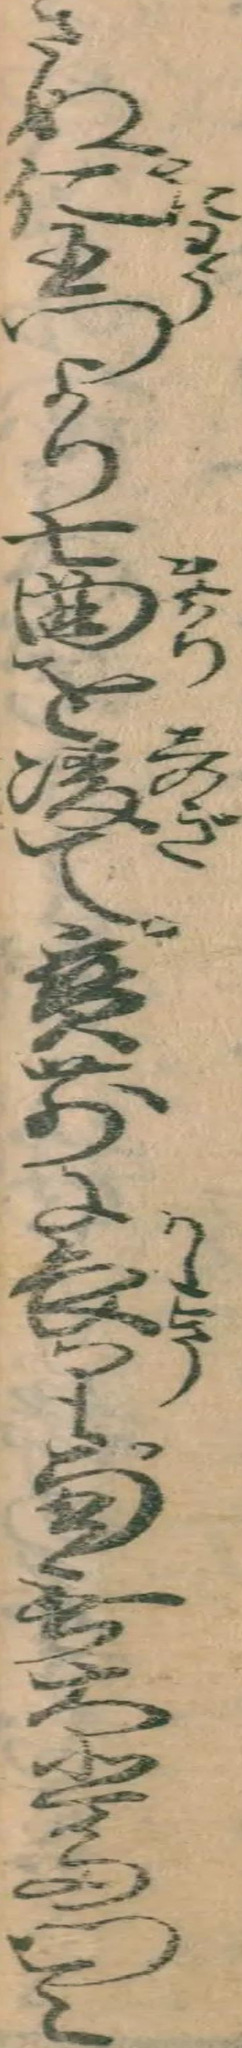きぬ。仁王門より七曲を凌て。宝前に畏り。南無大悲多門天
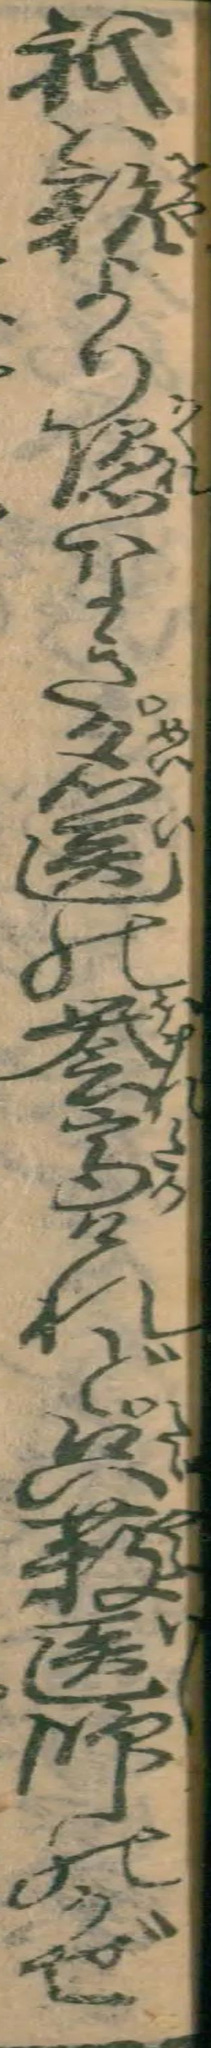我は親より隠なき。名医の誉高けれど。只薮医師のかぜ
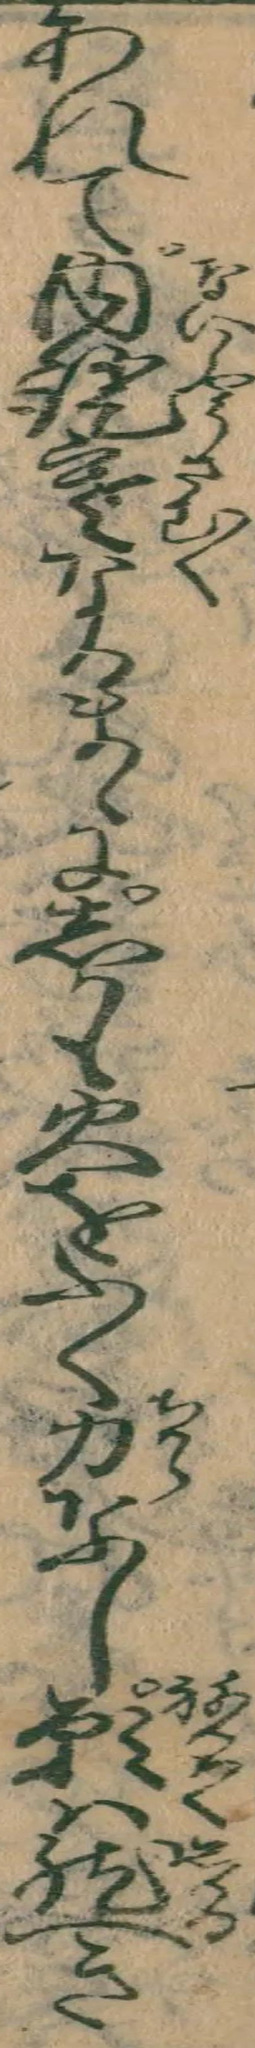あれて。内証寒なるまゝに。しかも火をふく力なし。願は然へき
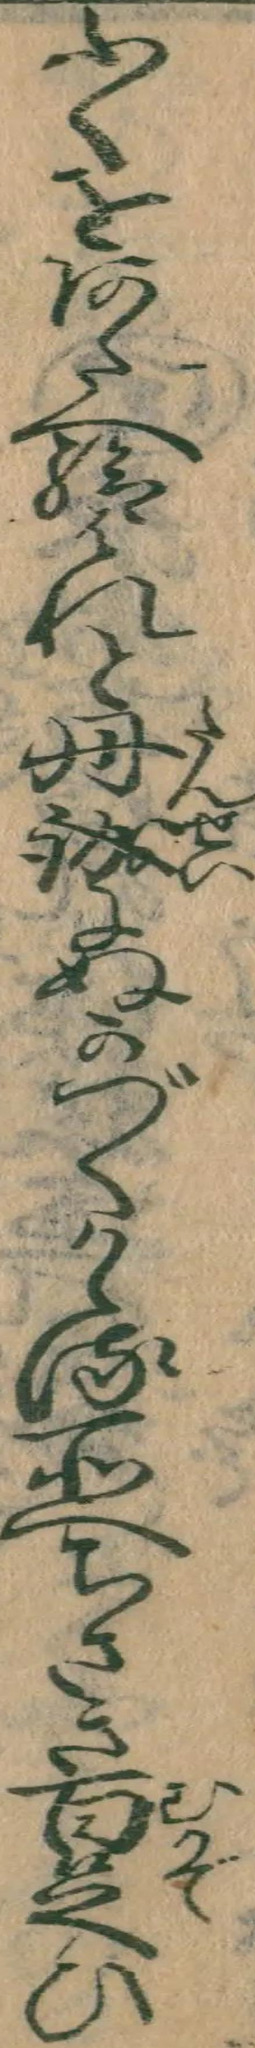ふくをあたへ給はれと丹誠にぬかづくかゝる所へちさき百足ひ
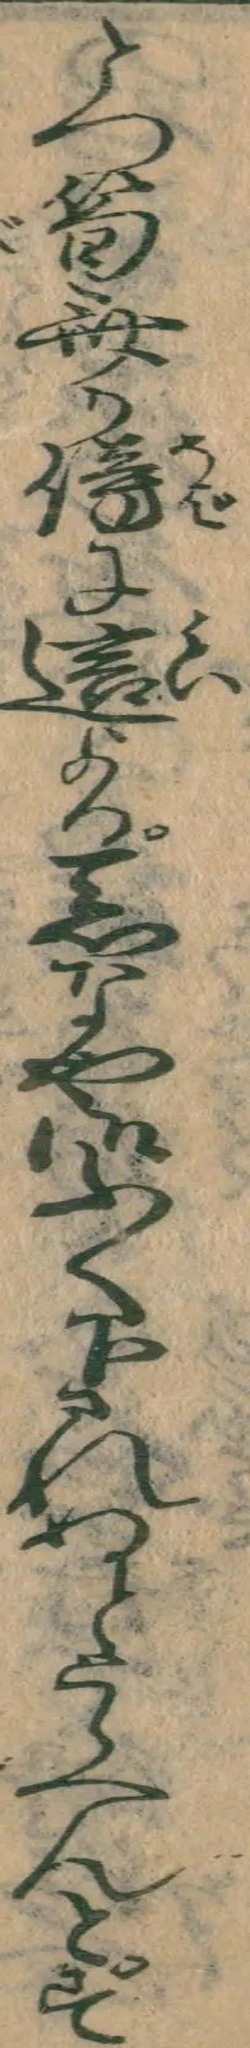とつ筍斎か傍に這よる。忝なや御ふく下されぬととらへんと。す
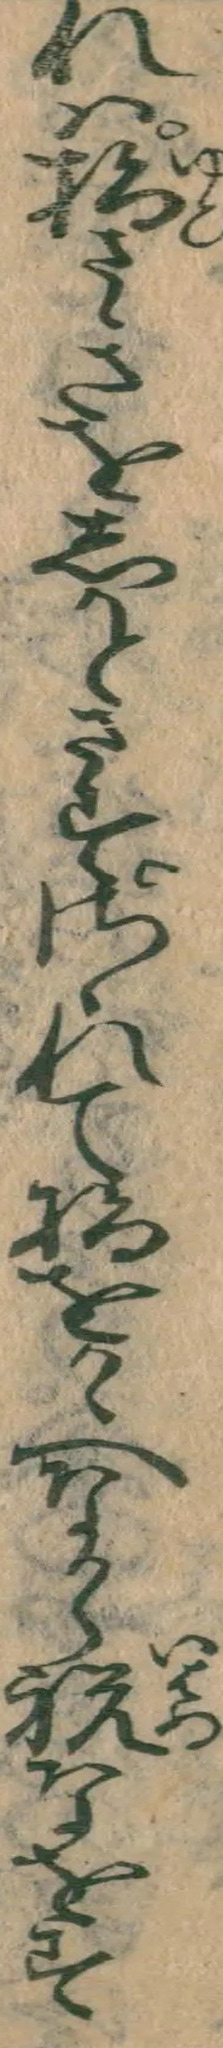れは。指さきをしかとさす。さゝれて指をかゝへなから祝なをす
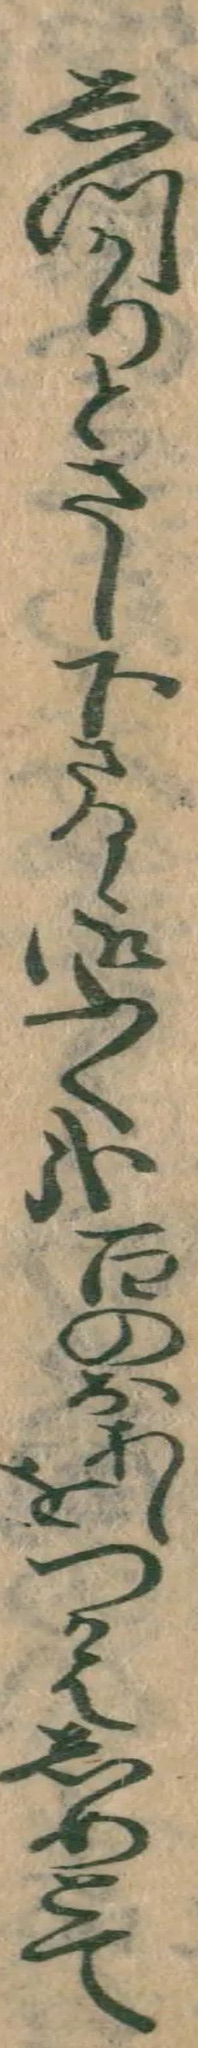しつかりとさし下さるゝ御ふく哉百のおあしをつかはしめとて
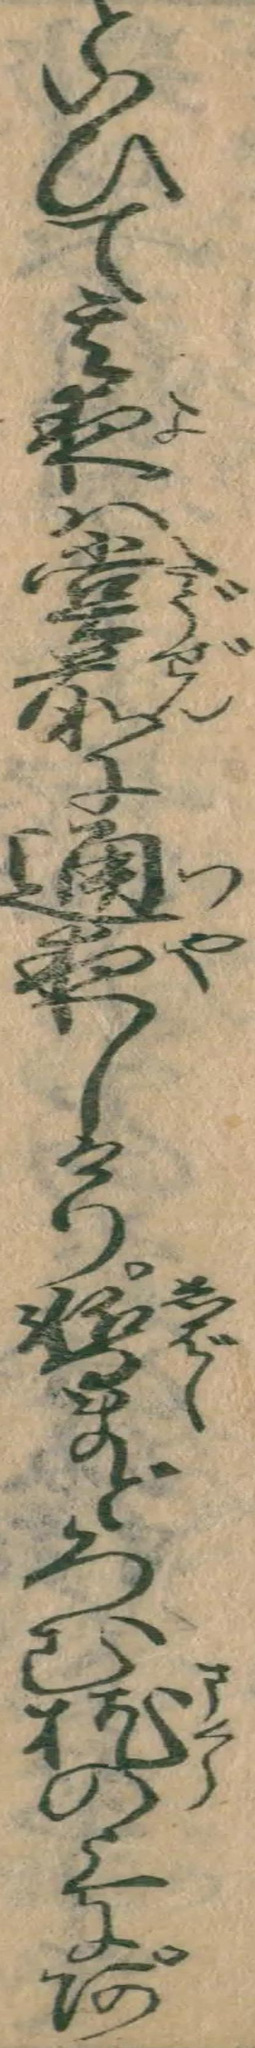といひて其夜は堂前に通夜しけり。暫まどろむ枕の上に。あ
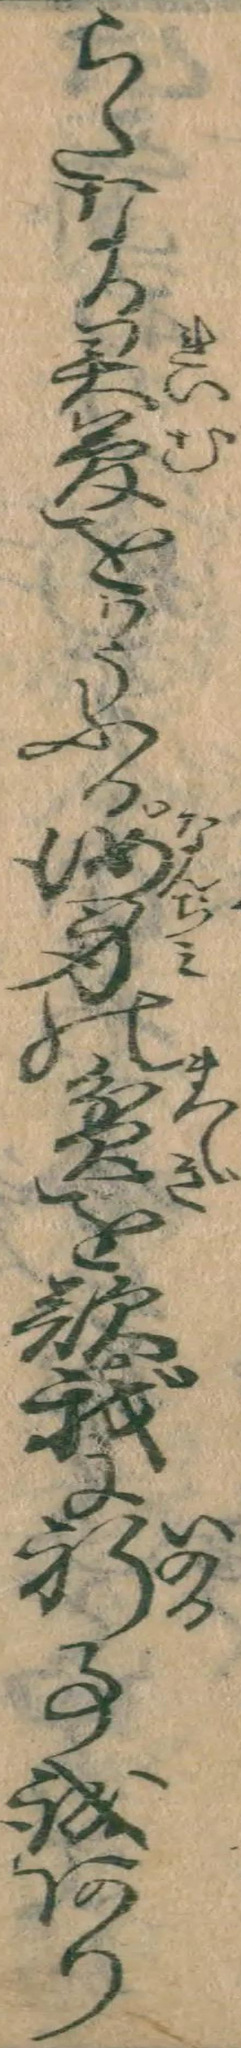らたなる霊夢をかうふる。汝身の貧を欲。我に祈事誠あり
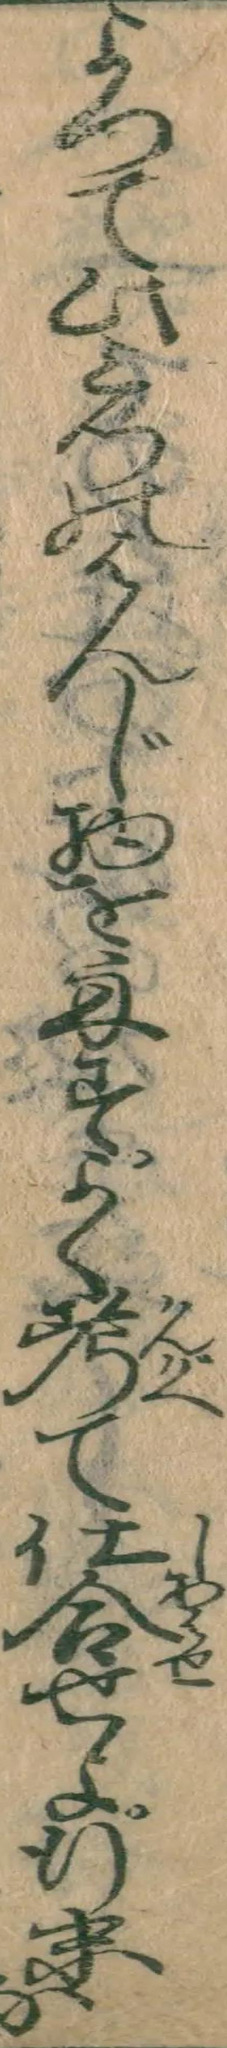よつて此三つのはんじ物を示す。よく考て仕合せよ。行末な
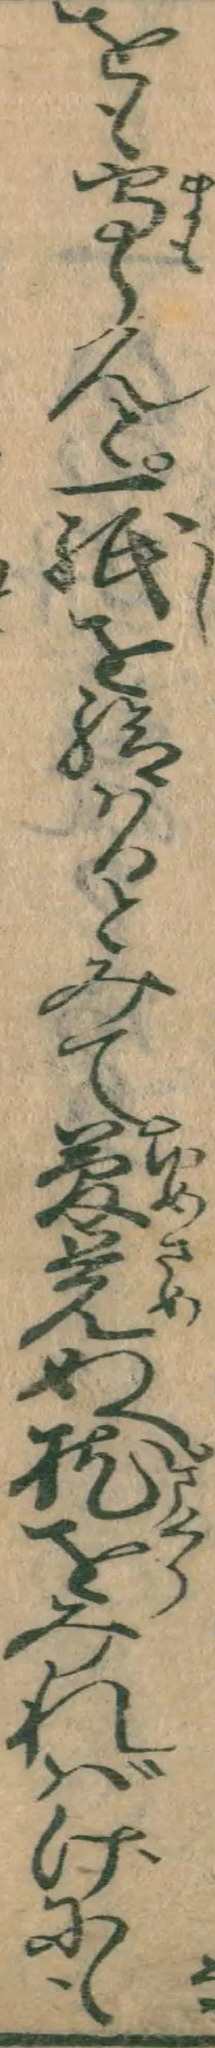をも守らんと。一紙を給はるとみて。夢覚ぬ。枕をみればげにも
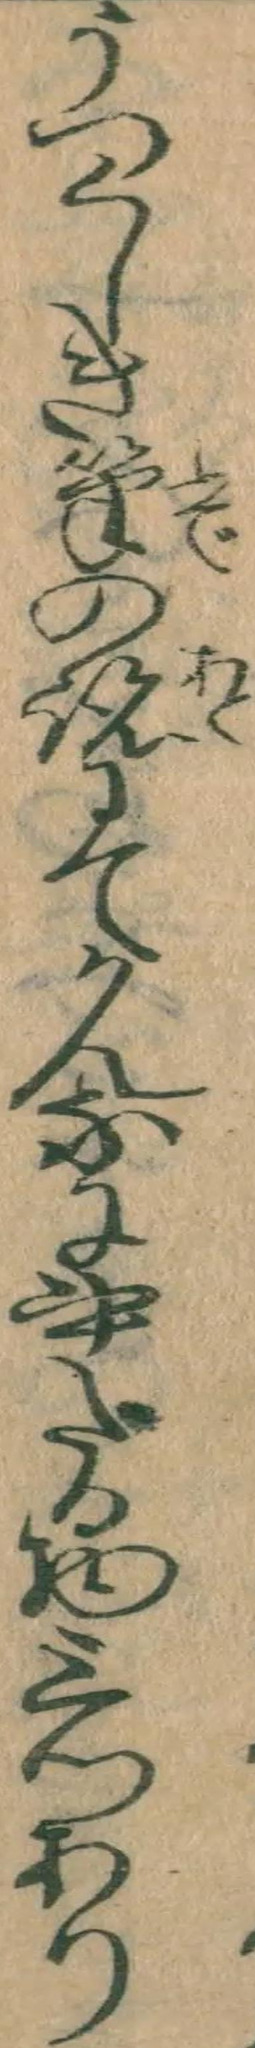うつくしき筆の跡にてかんなに書だる物三つあり

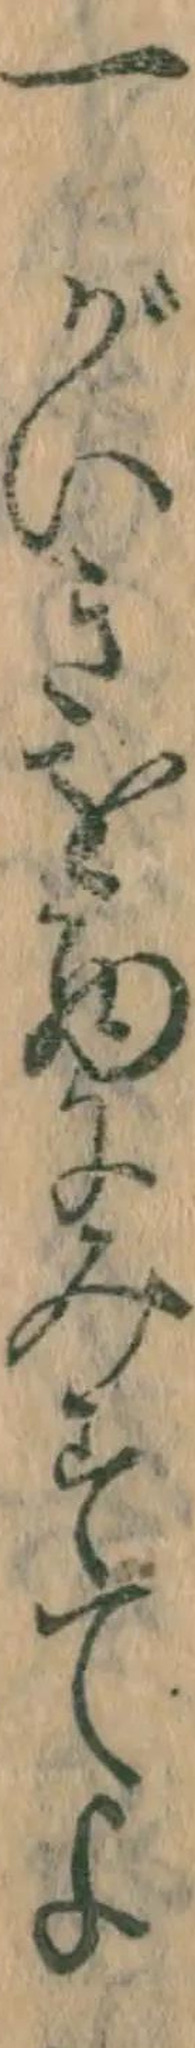一がいきを西にみすてよ
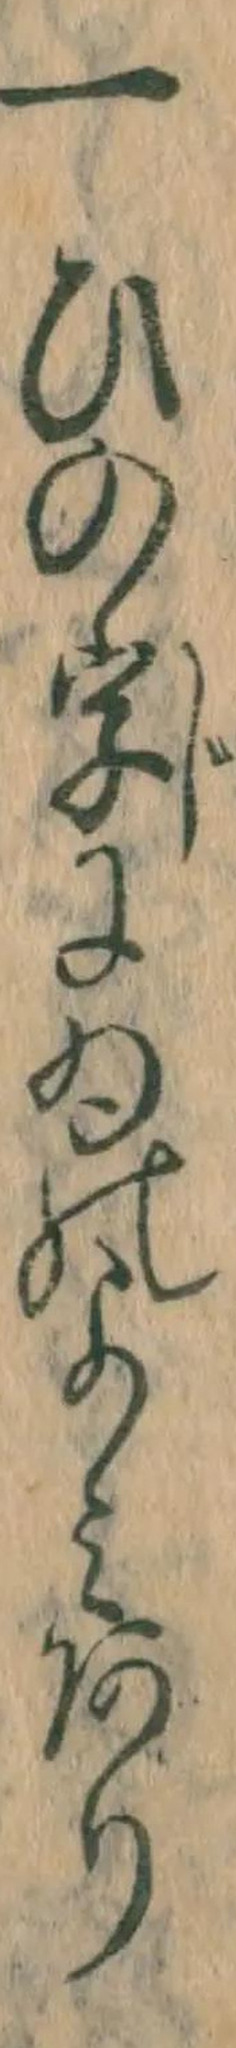一ひの字にゐのよみあり
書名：新竹斎 5巻
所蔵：国立国会図書館 National Diet Library, JAPAN
